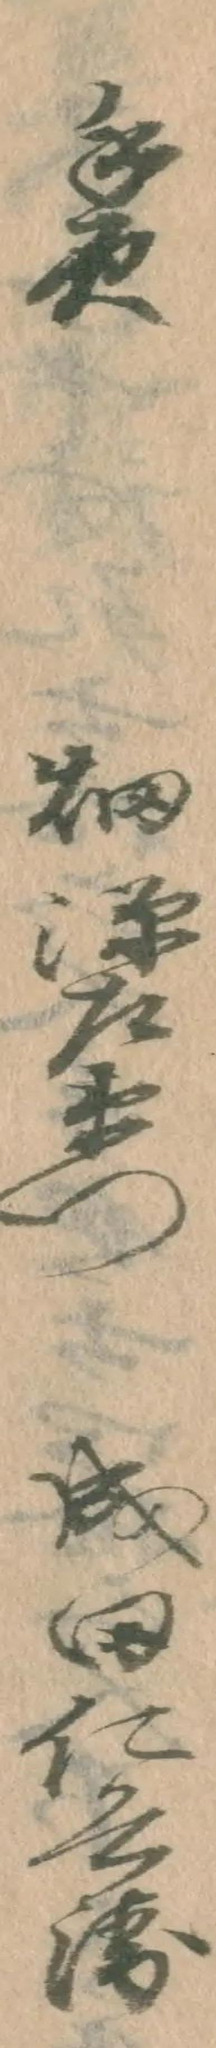手負畑源左衛門成田仁兵衛
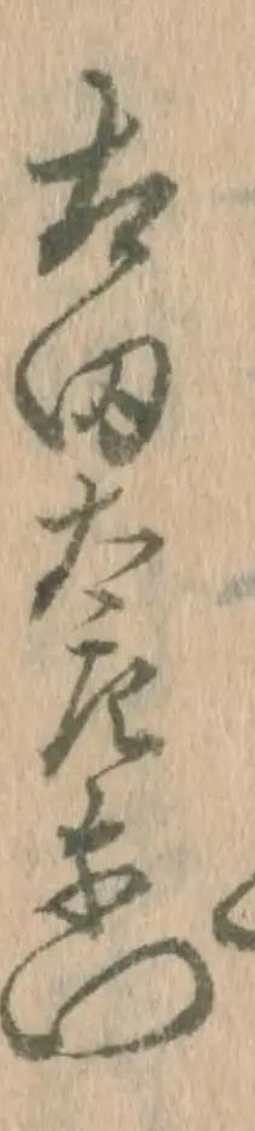吉田太郎左衛門
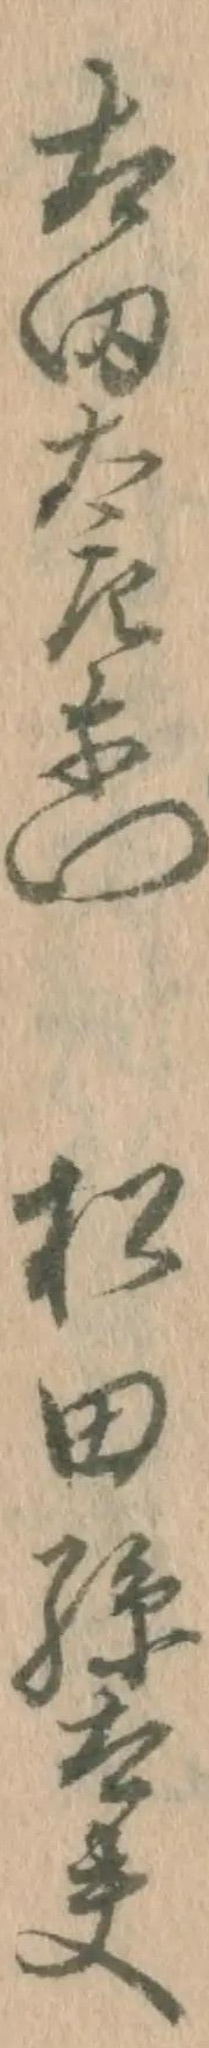太田太左衛門松田孫太夫
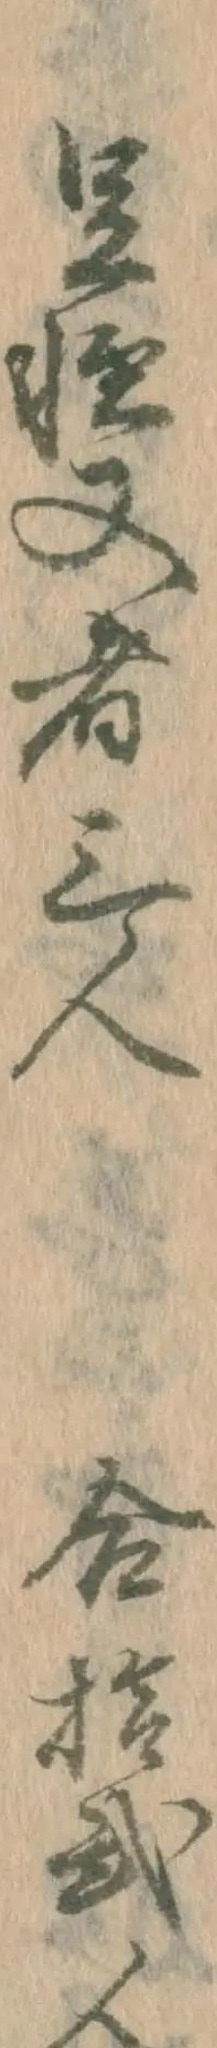足軽又者三人合拾弐人
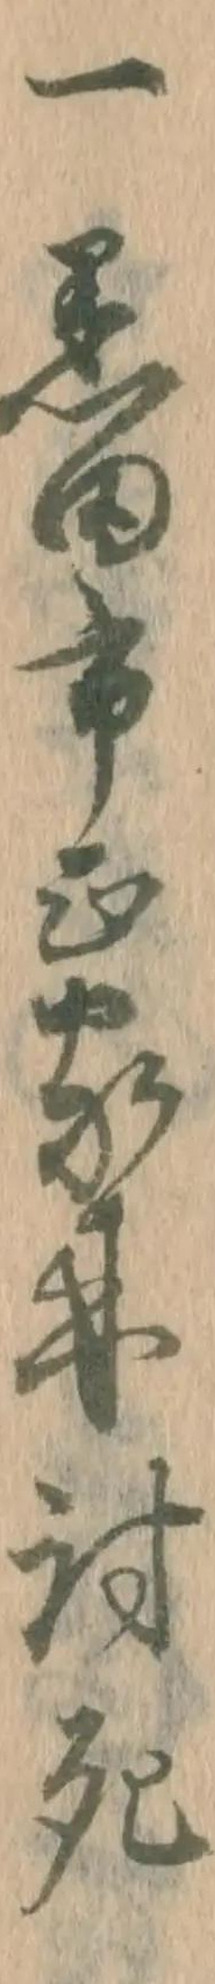一黒田市正家来討死
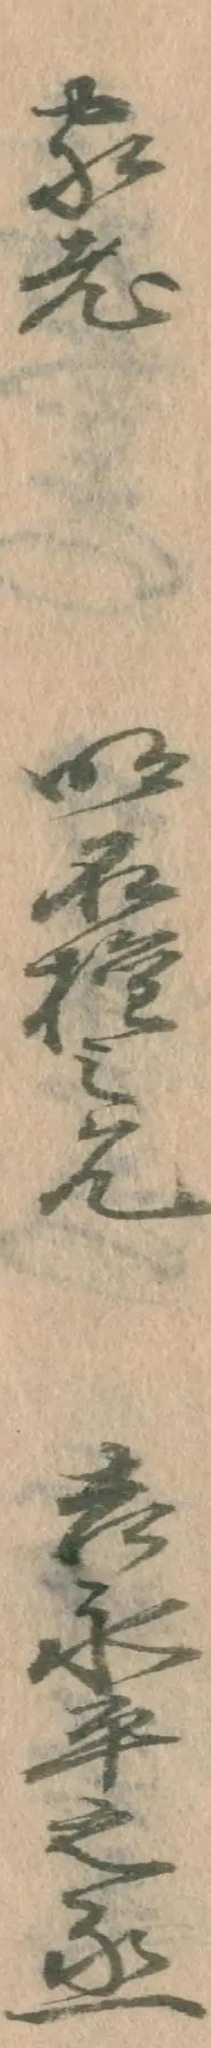家老明石権之允吉永平之丞
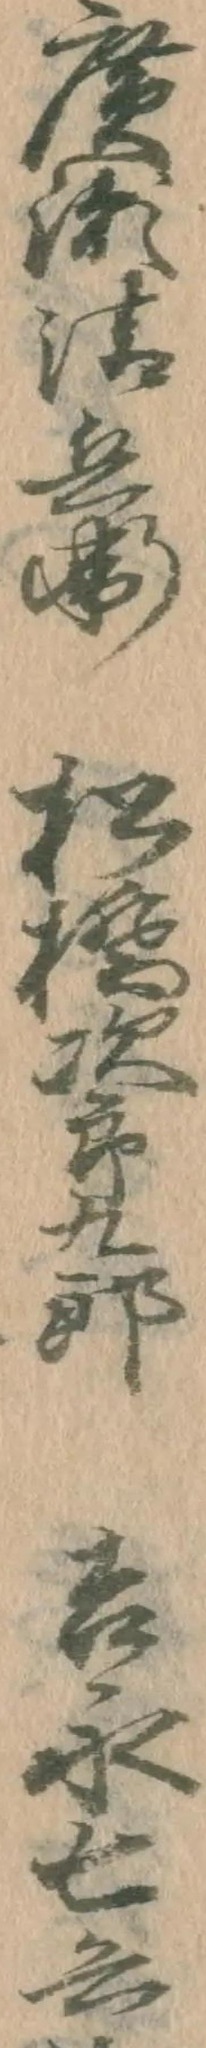広瀬清兵衛松橋次郎九郎吉永七兵衛
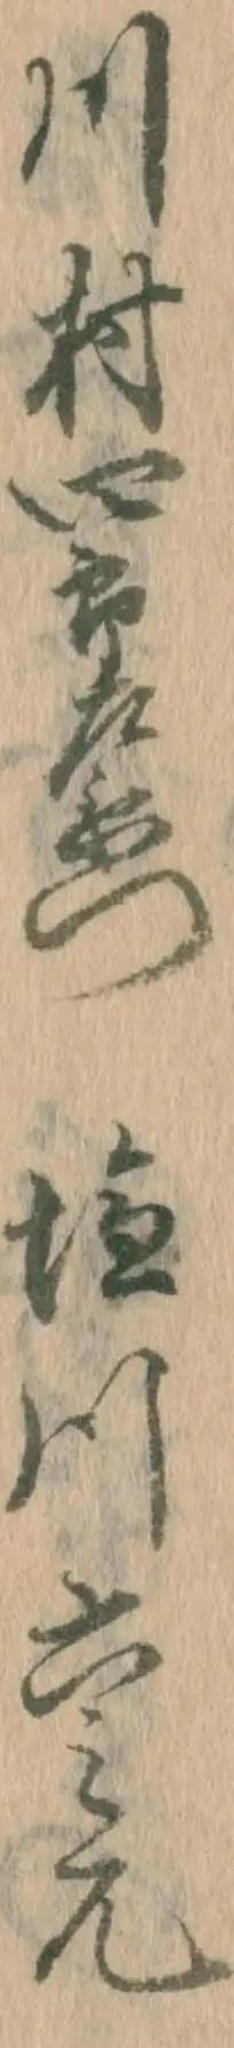川村四郎左衛門塩川六之允
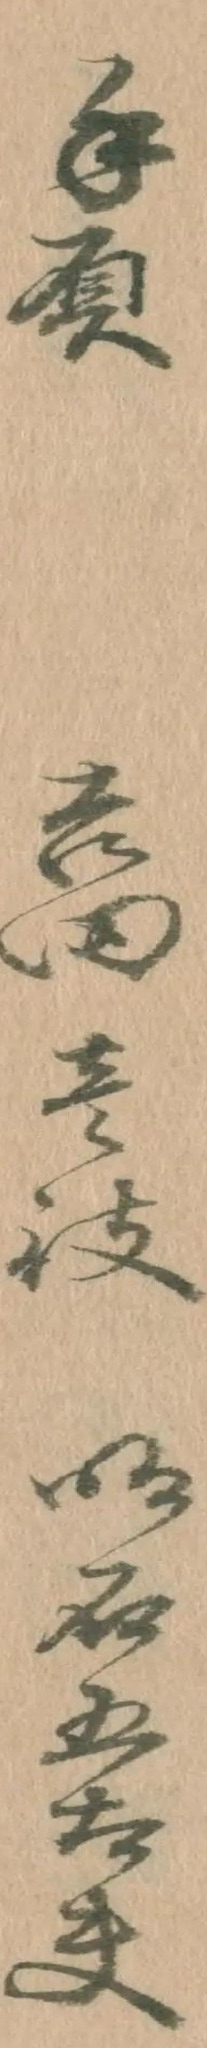手負吉田壱岐明石五太夫
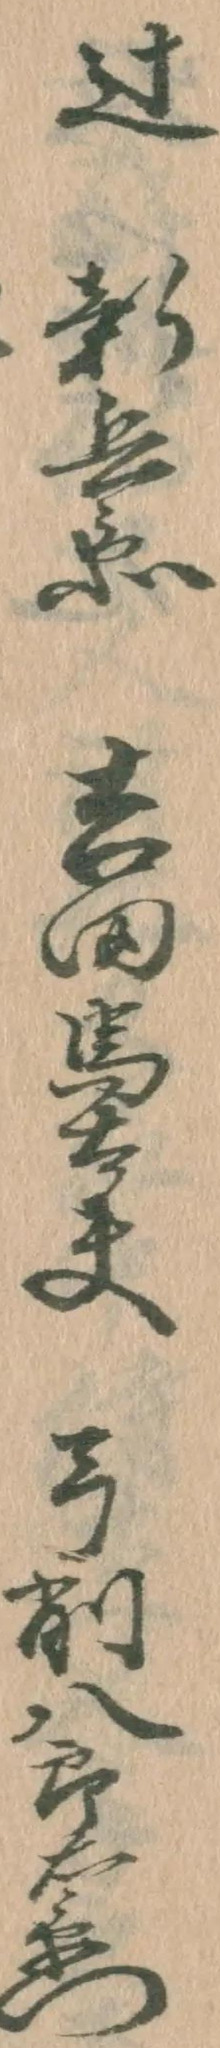辻新兵衛吉田馬太夫弓削八郎右衛門
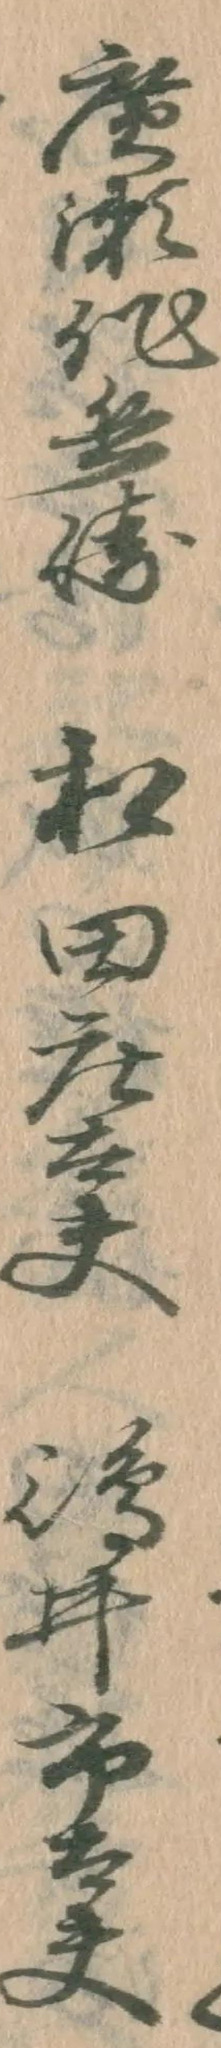広瀬作兵衛松田庄太夫島井市太夫
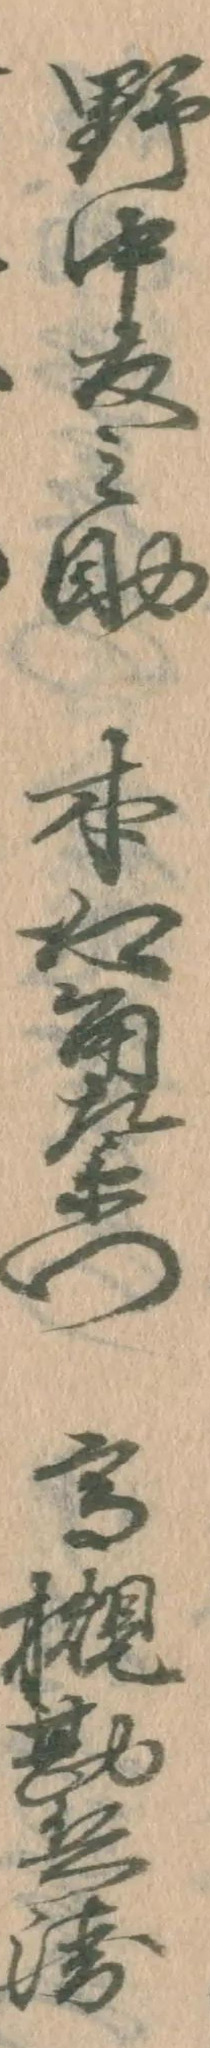野中友之助本郷角左衛門高槻勘兵衛
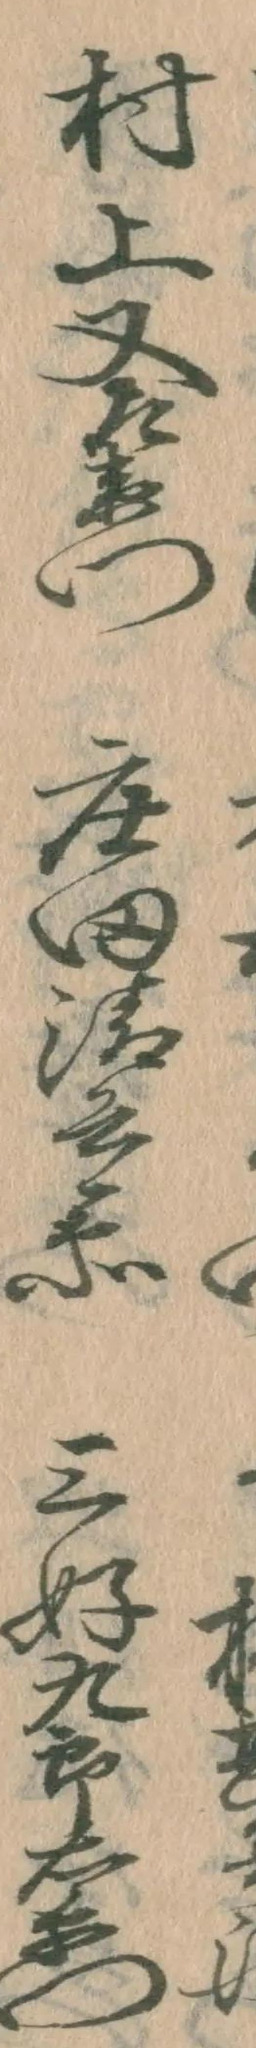村上又左衛門庄田清兵衛三好九郎右衛門
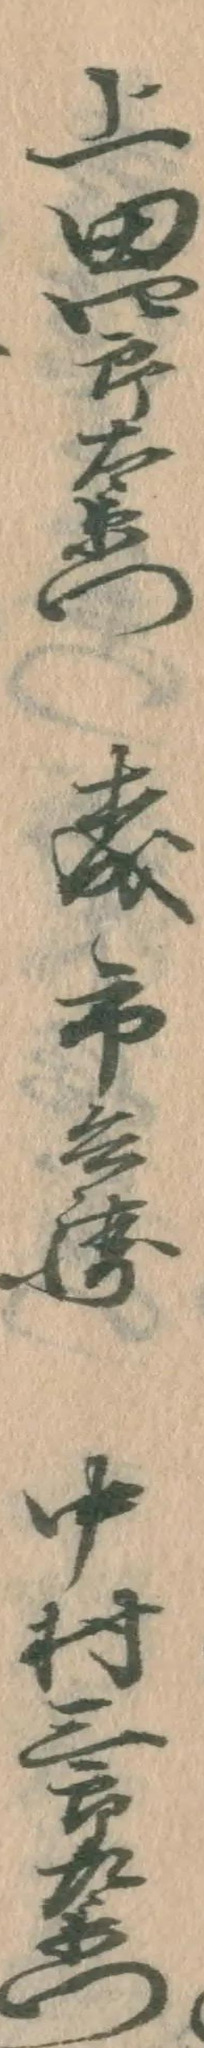上田四郎右衛門森市兵衛中村三郎左衛門
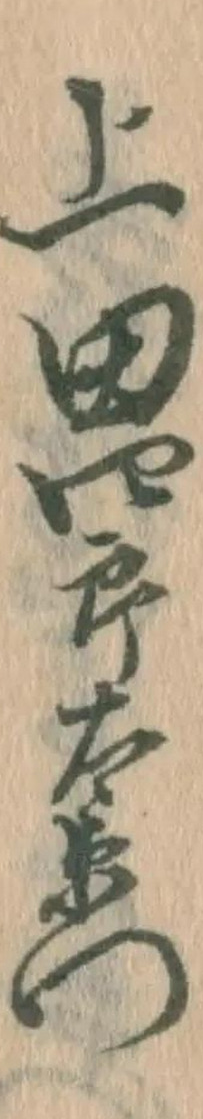吉田太郎左衛門
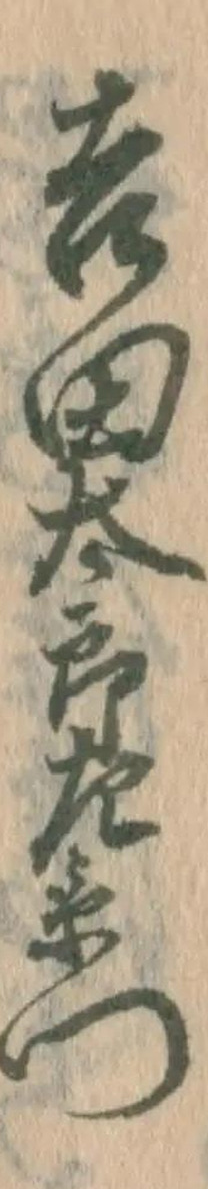吉田太郎左衛門
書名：切支丹御退治記 49巻. [7]
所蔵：国立国会図書館 National Diet Library, JAPAN
